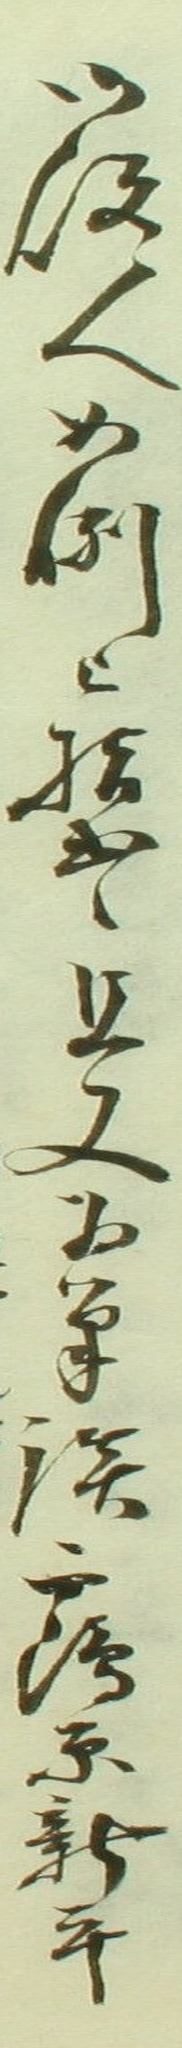御役人如例被指出候且又為筆談靏原新平
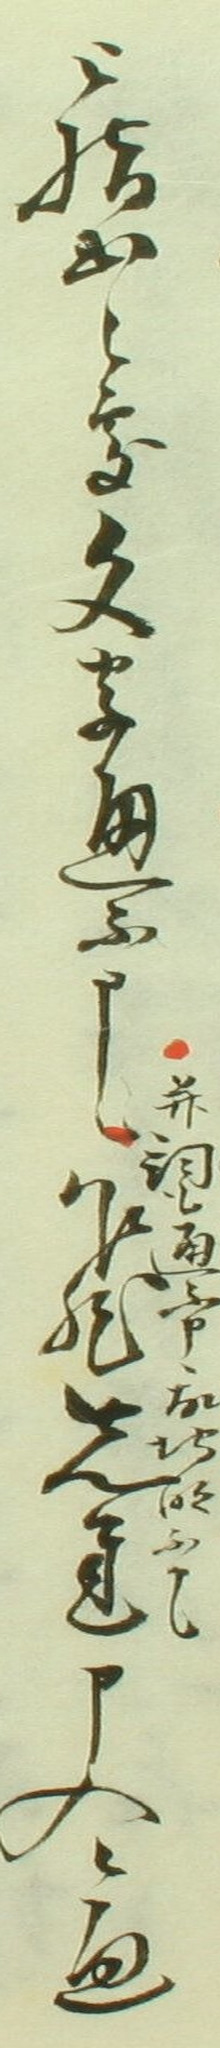被指出候処文字通不申赤点乍然先達申合通
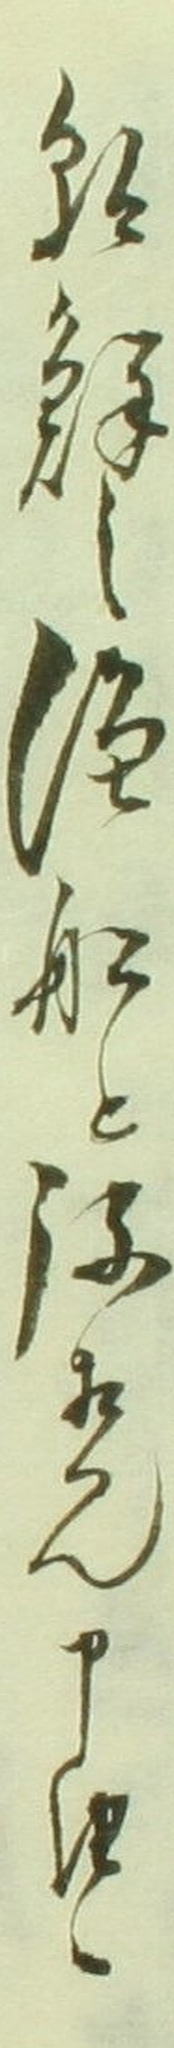朝鮮之漁船と弥相見申由候
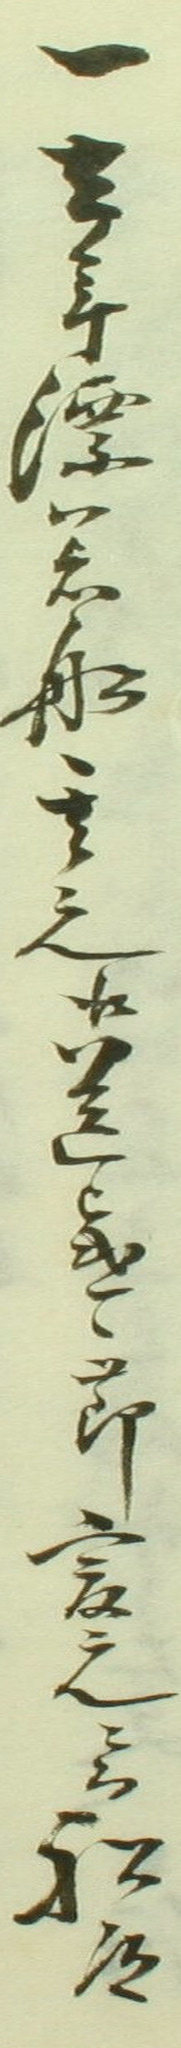一去年漂着船其元江送被遣候節爰元二而船道
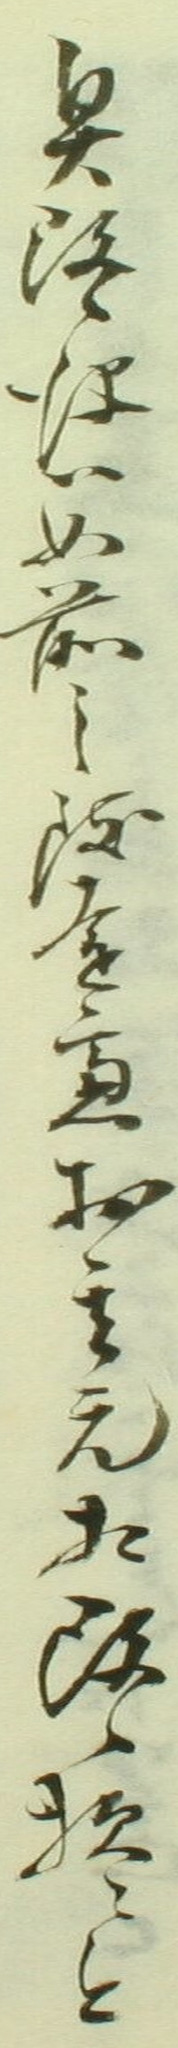具改候儀ハ如前之改遠慮於其元相改候様ニと
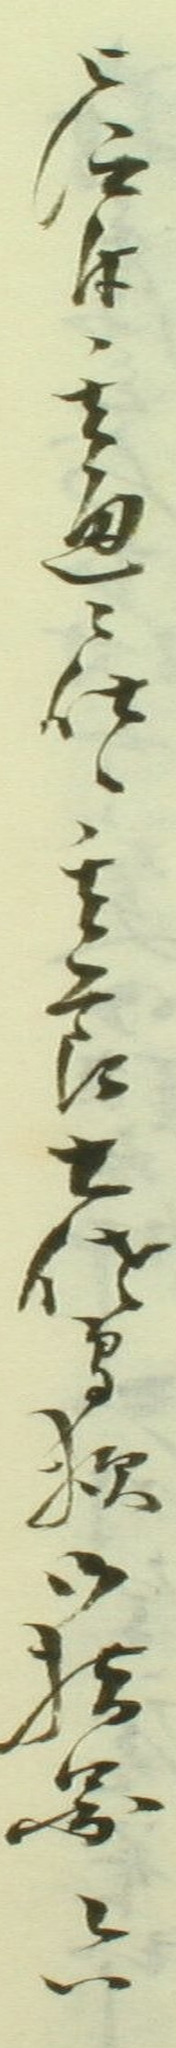被仰付其通ニ仕候其節土佐守様御指図ニハ
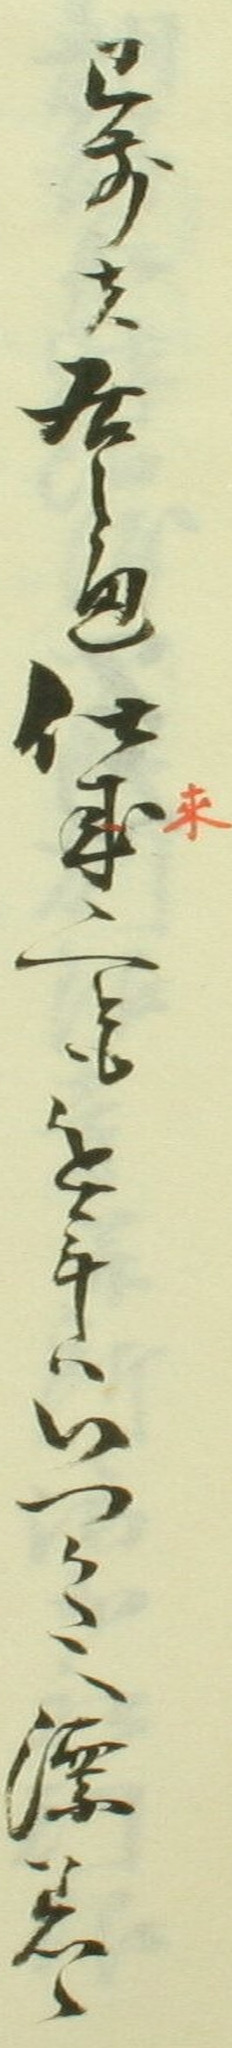已前者右之通仕来候へとも近年ハいつかたへ漂着候
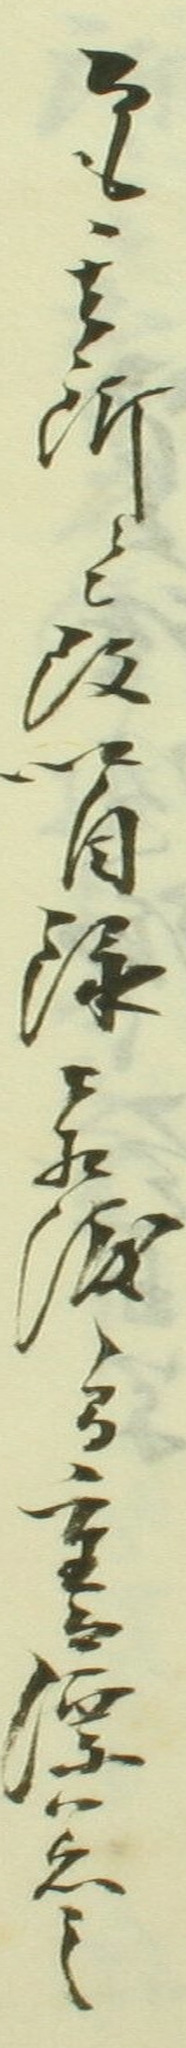而も其所ニて改以目録被相渡候間重而漂着之
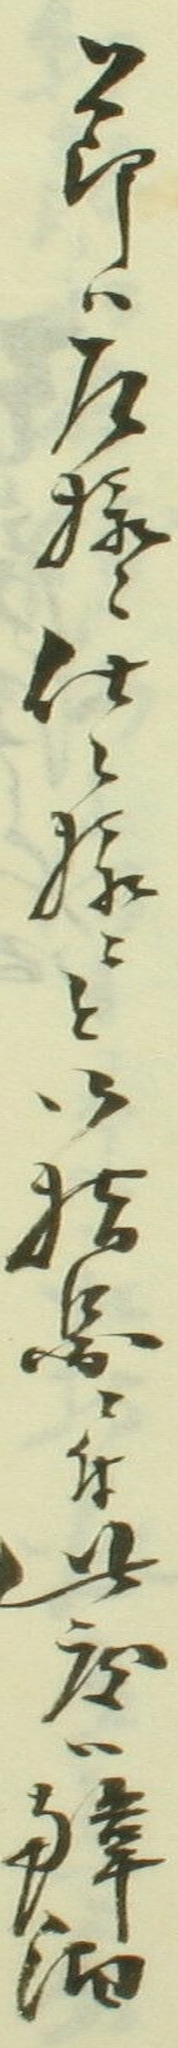節ハ左様ニ仕候様ニと御指図ニ付此度ハ韓泊
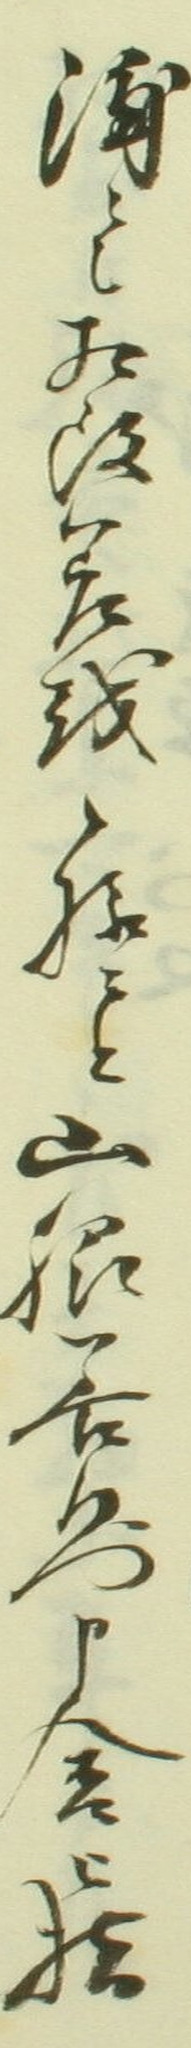浦にて相改差越候様ニと山脇善左衛門申含被指
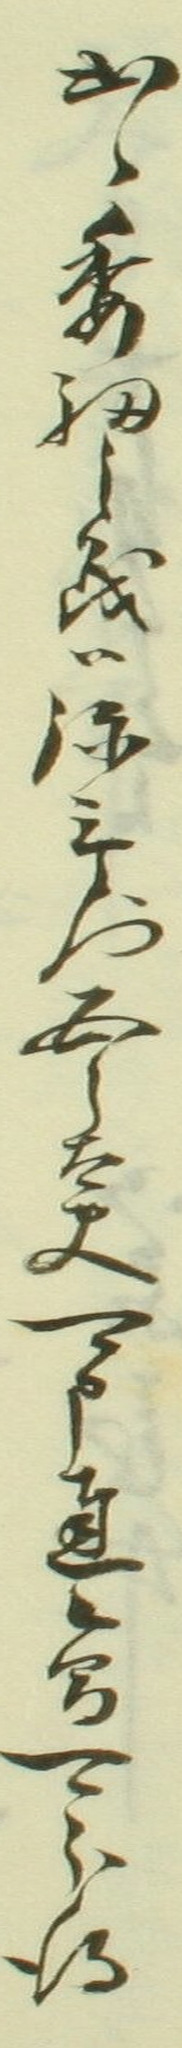出候委細之義ハ弥三右衛門五郎大夫可申達候間可被得
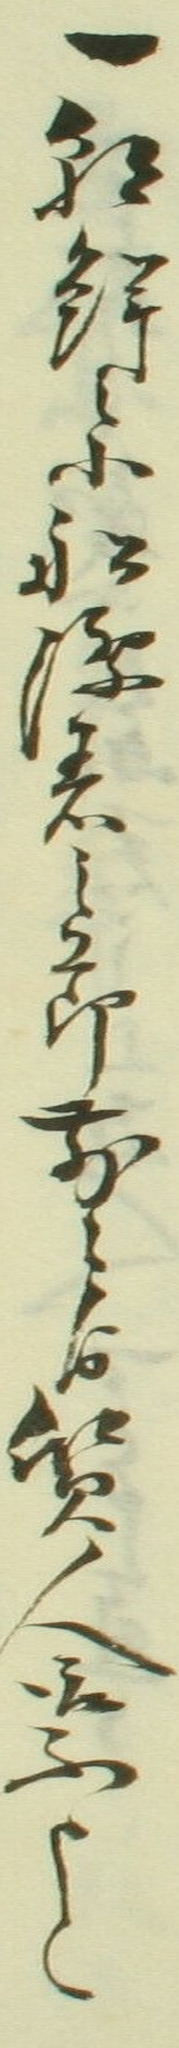一朝鮮之小船漂着之節前々ゟ質人取不申候
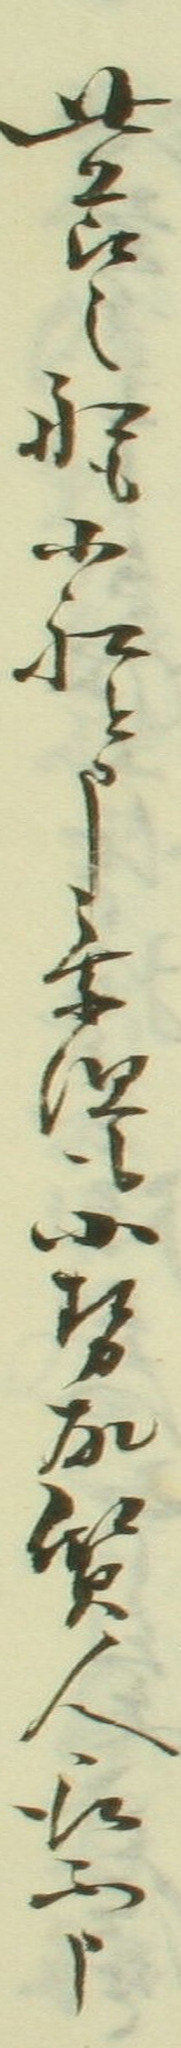此節之船も小船と申乗組も小勢故質人取不申
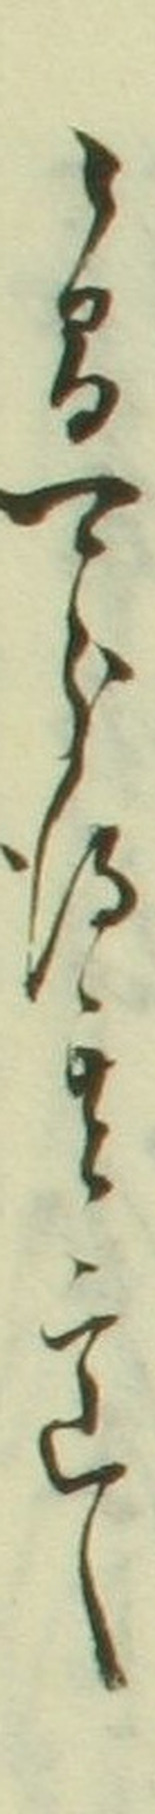候間可被得其意候
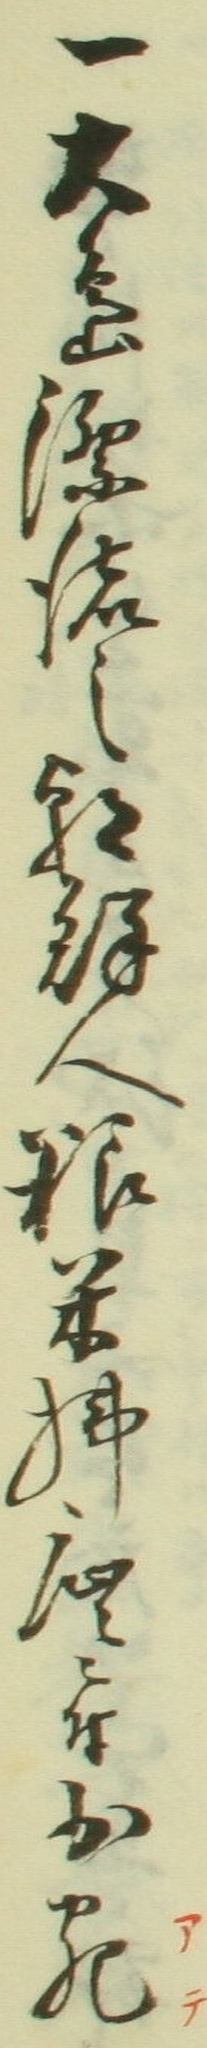一大嶋漂流之朝鮮人糧米払底ニ付少宛

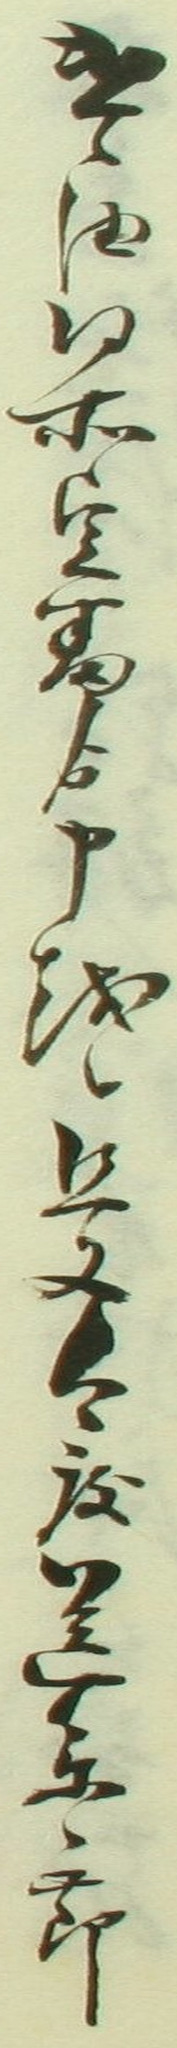遣候由同所定番ゟ申越候且又今度送参候節
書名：異国船漂着記
